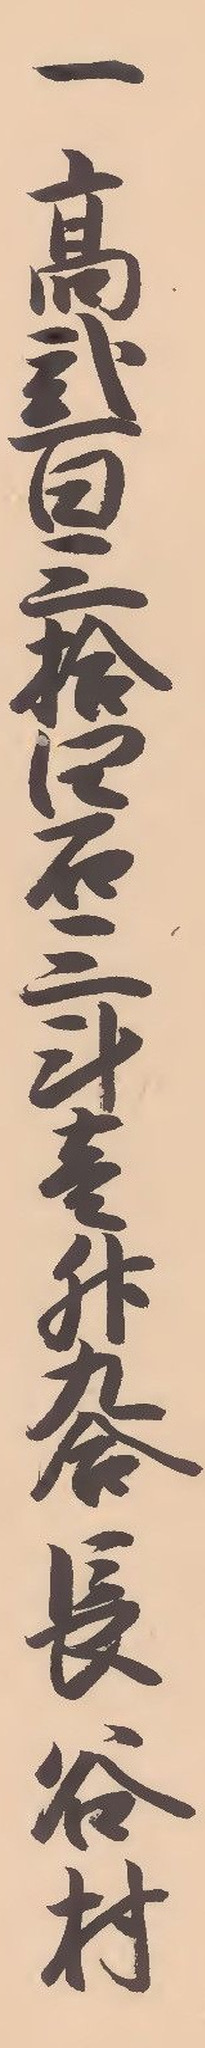一高弐百三拾四石三斗壱升九合長谷村
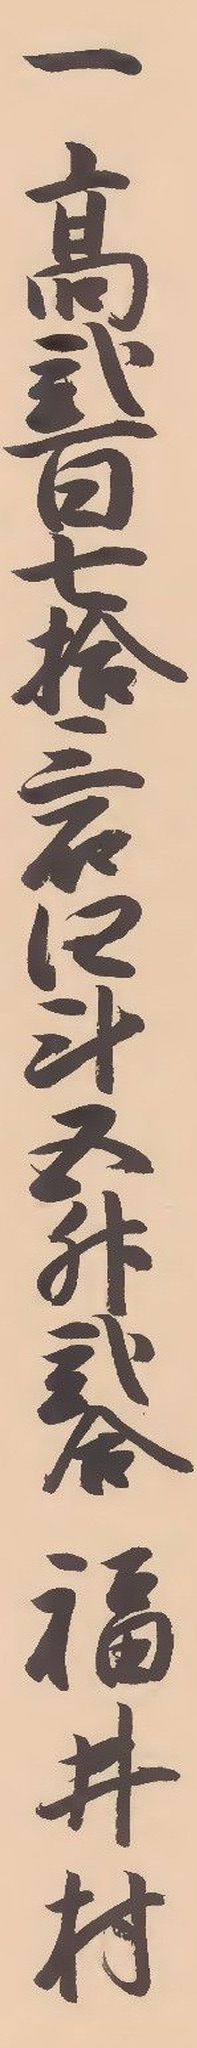一高弐百七拾三石四斗五升弐合福井村
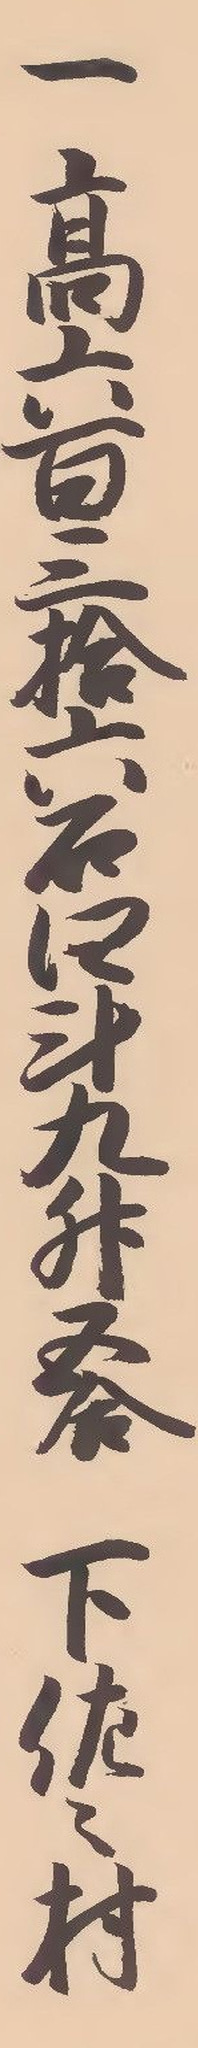一高六百三拾六石四斗九升五合下佐々村
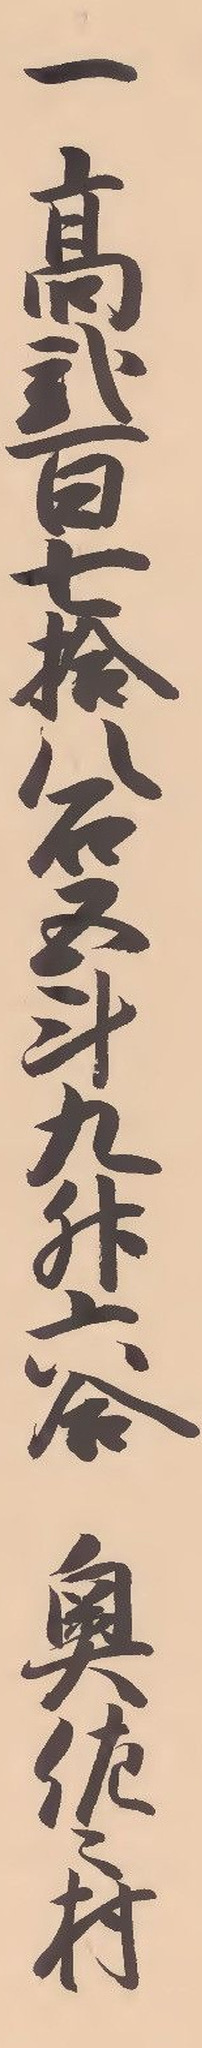一高弐百七拾八石五斗九升六合奥佐々村
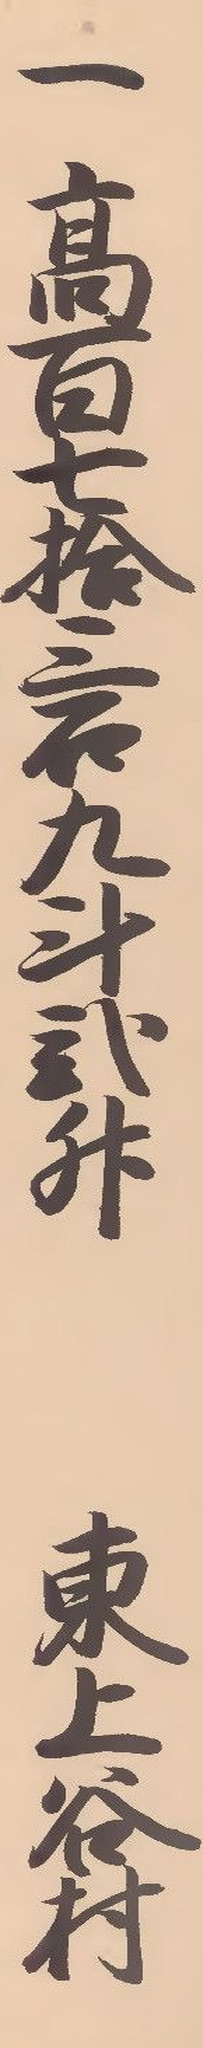一高百七拾三石九斗弐升東上谷村
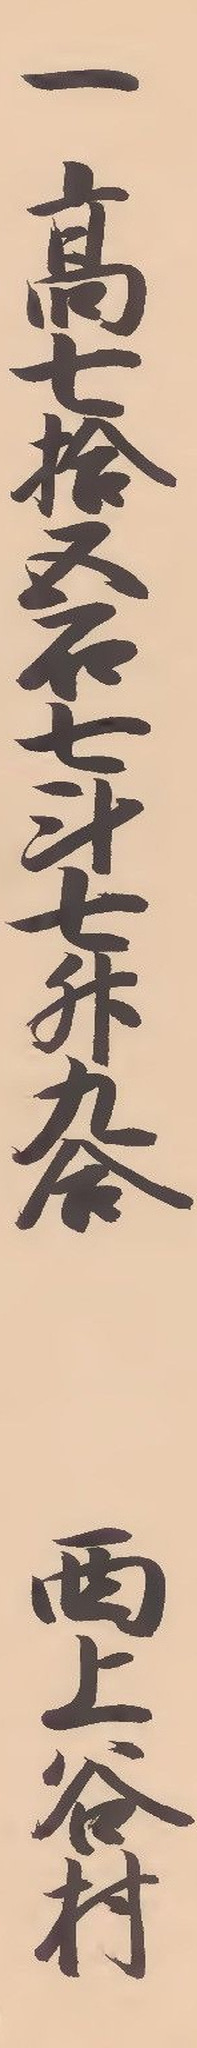一高七拾五石七斗七升九合西上谷村
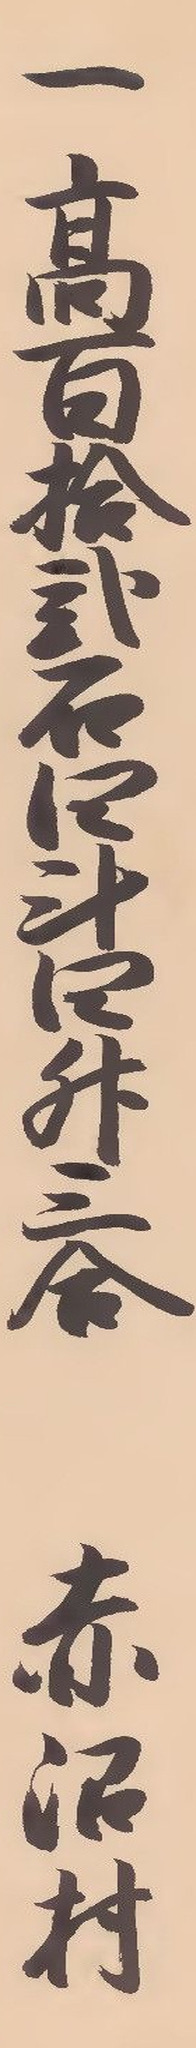一高百拾弐石四斗四升三合赤沼村
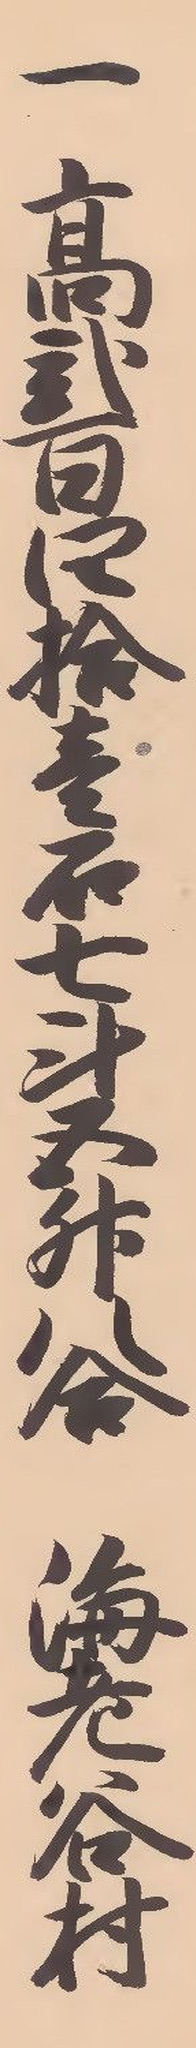一高弐百四拾壱石七斗五升八合海老谷村

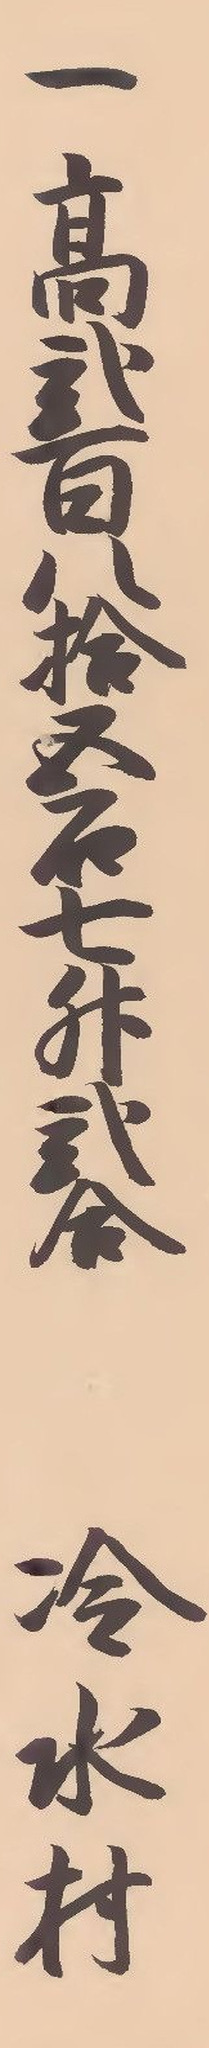一高弐百八拾五石七升弐合冷水村
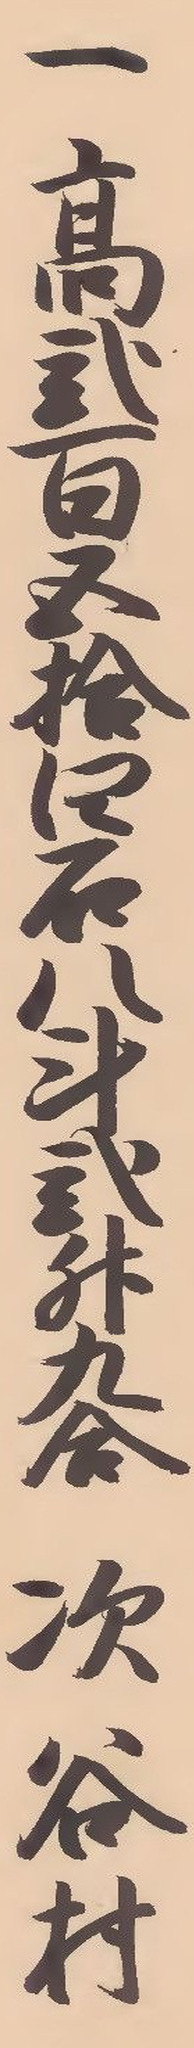一高弐百五拾四石八斗弐升九合次谷村
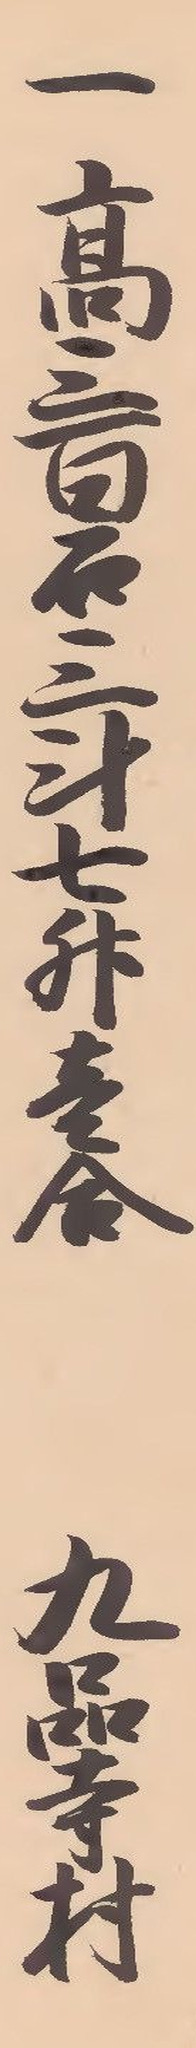一高三百石三斗七升壱合九品寺村
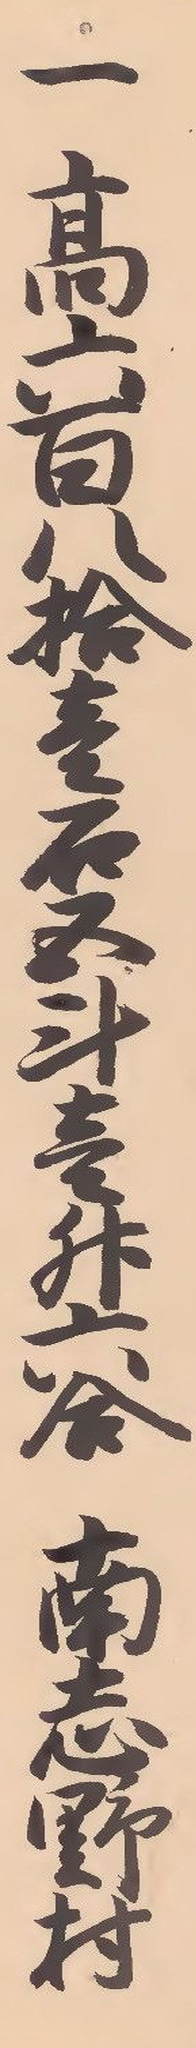一高六百八拾壱石五斗壱升六合南志野村
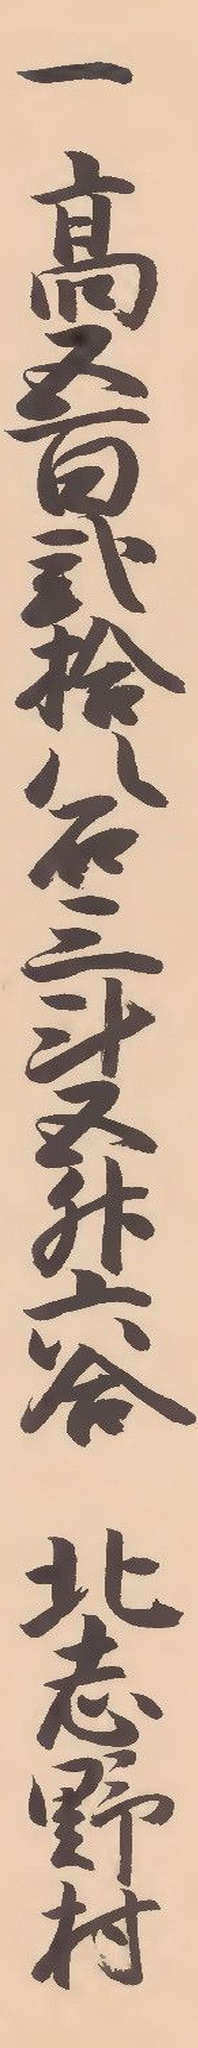一高五百弐拾八石三斗五升六合北志野村
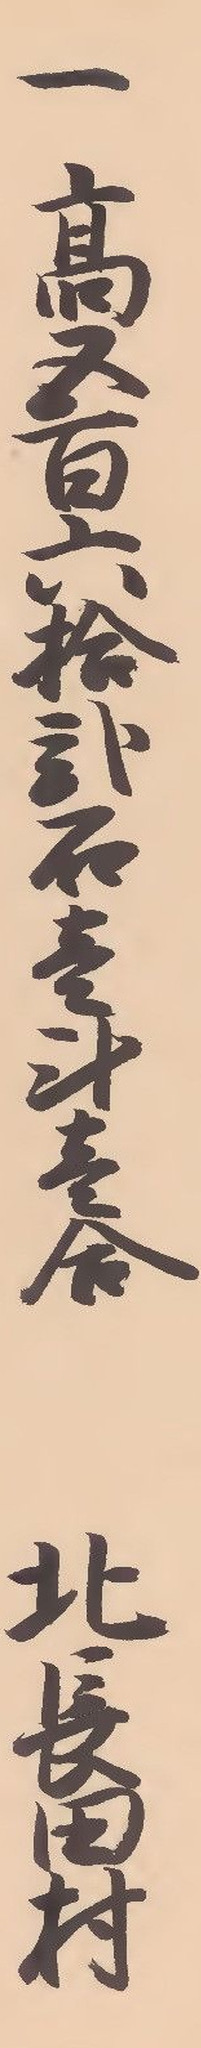一高五百六拾弐石壱斗壱合北長田村

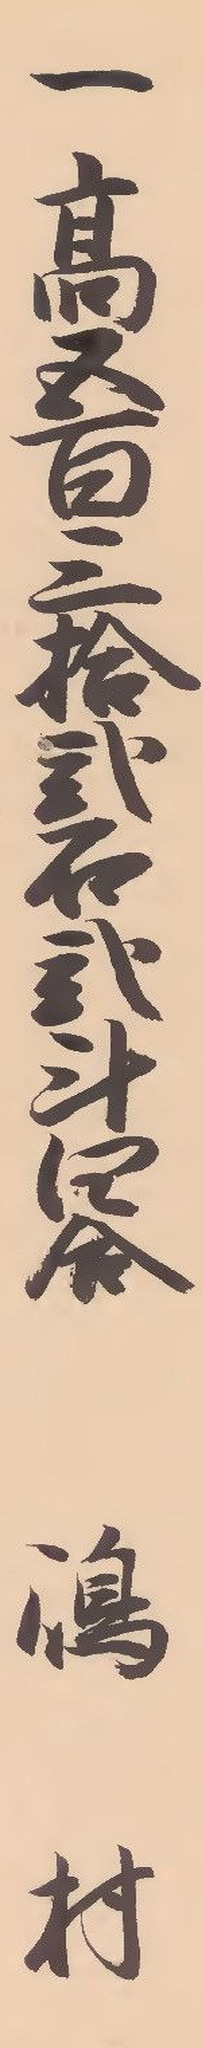一高五百三拾弐石弐斗四合島村
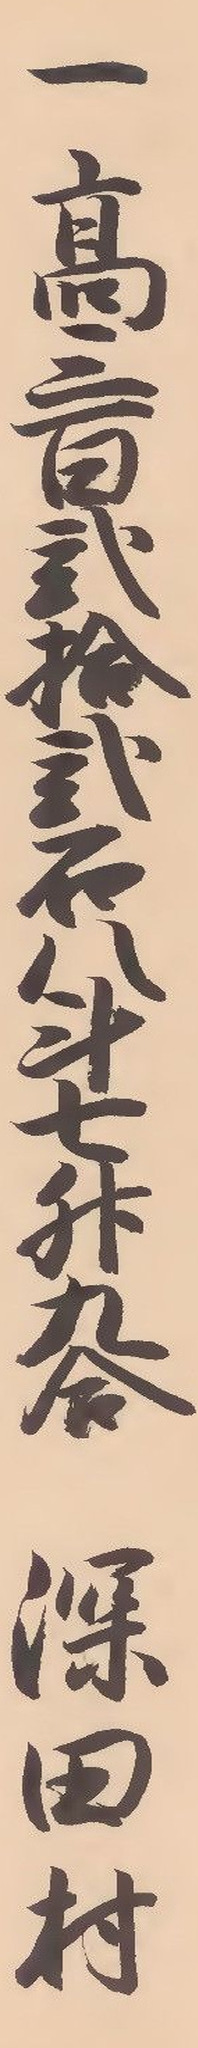一高三百弐拾弐石八斗七升九合深田村
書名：紀伊国郷帳
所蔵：国立公文書館 National Archives of Japan
